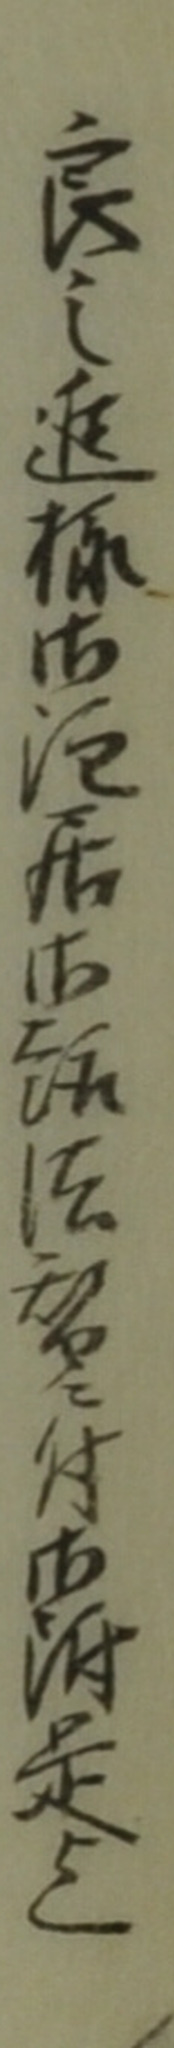良之進様御住居御趣法替ニ付御附是迄
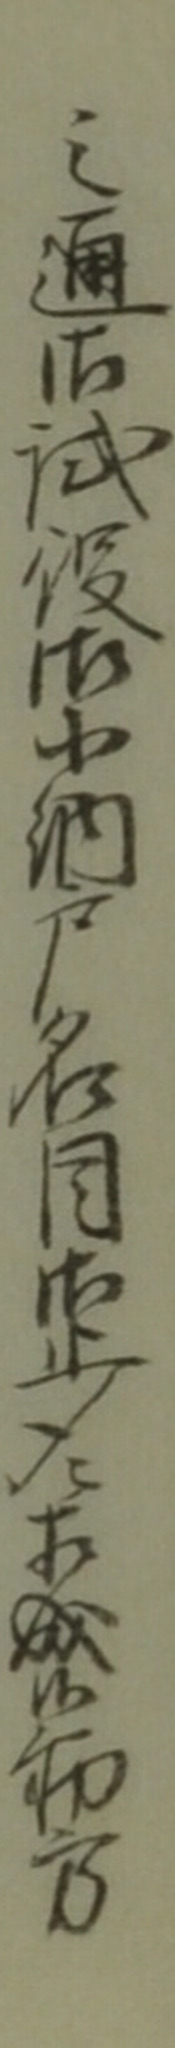之通御試役御小納戸名目御止〆ニ相成候勤方
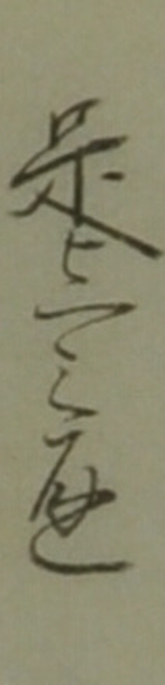是迄之通
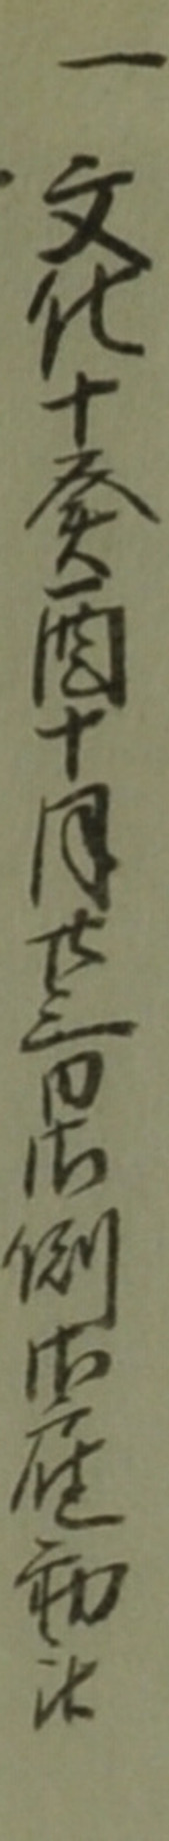一文化十癸酉十月廿三日御側御雇勤被
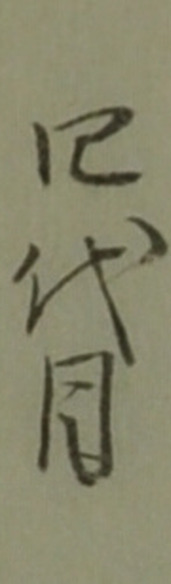四代目
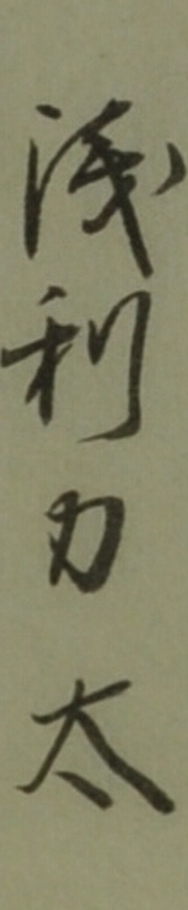浅利力太
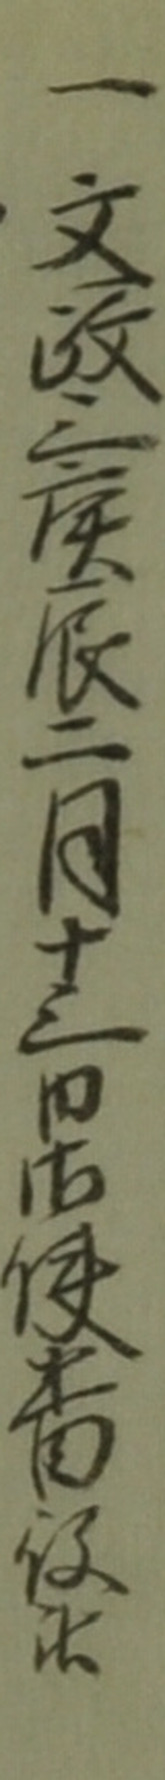一文政三庚辰二月十三日御使番役被
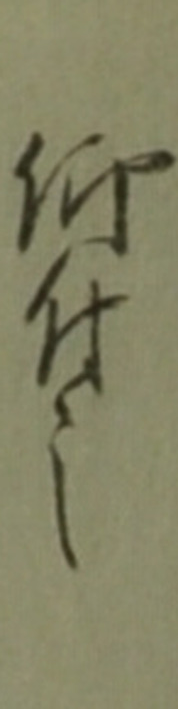仰付之
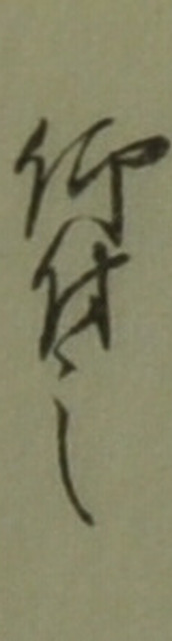仰付之
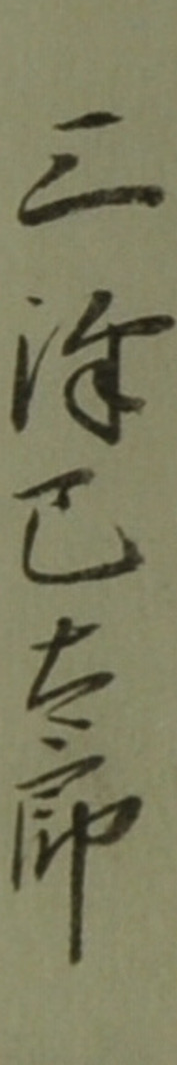三沢己太郎

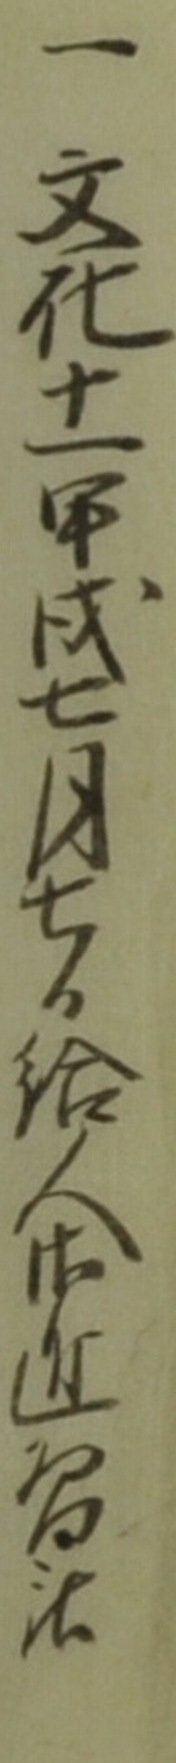一文化十一甲七月七日給人御近習被
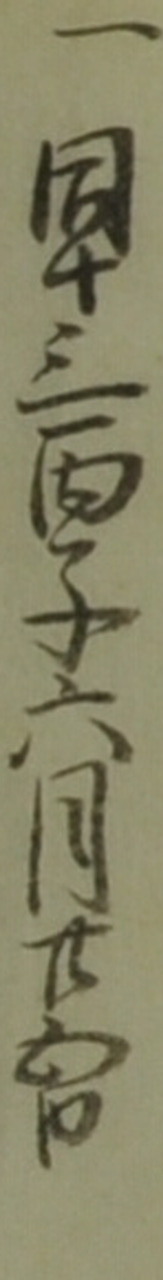一同十三丙子六月廿五日
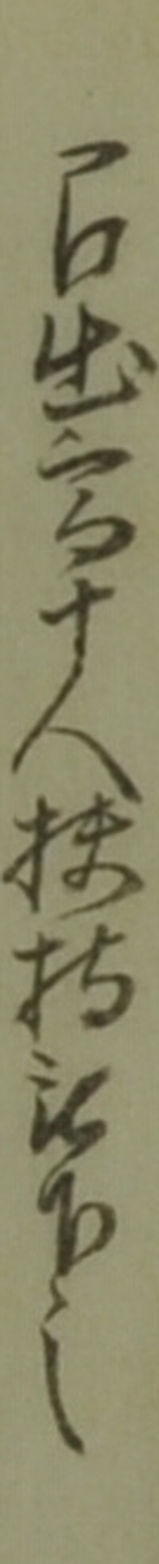召出高十人扶持被下之
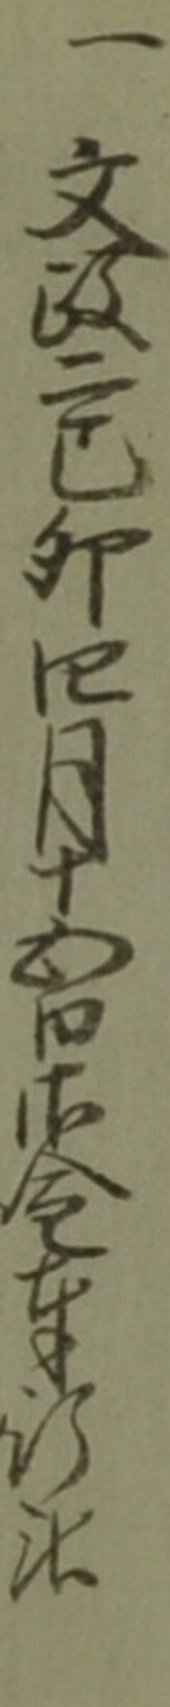一文政二己卯四月十五日御金奉行被
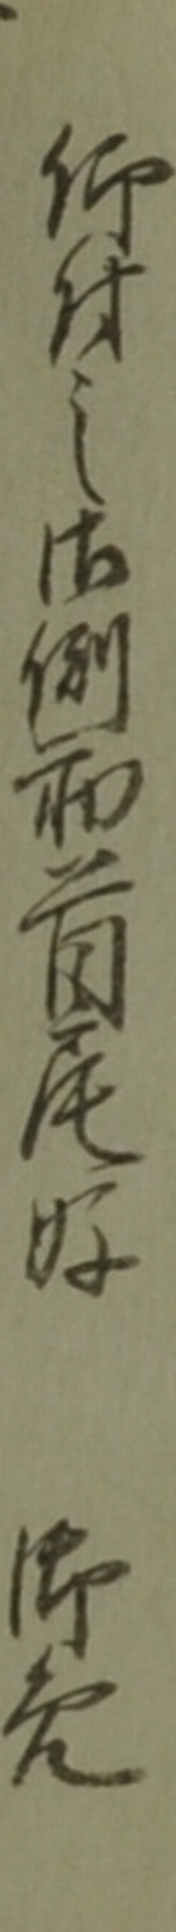仰付之御側勤首尾好御免
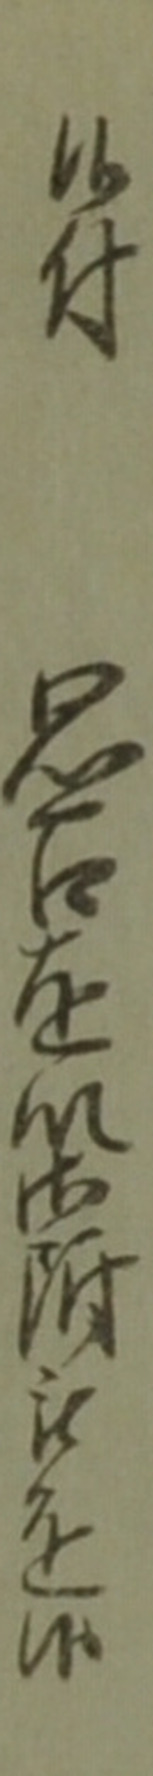候付思召を以御附被進候
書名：諸御役代々録（五）
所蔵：伊那市立高遠町図書館・合同会社AMANE
